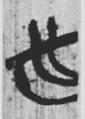必
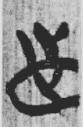○（止）
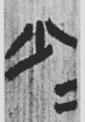少
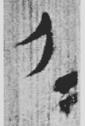人人
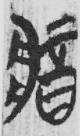𨟻（將）
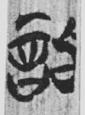訋（召）
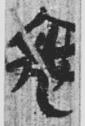○（寇）
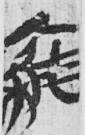○（稚）
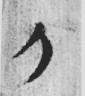人
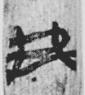弗
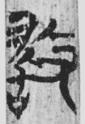敢（敢）
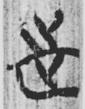○（止）
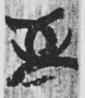至
